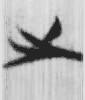之
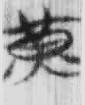黃
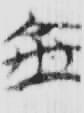金
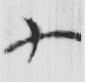七
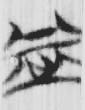益
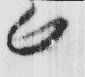㠯（以）
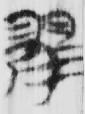翟（糴）
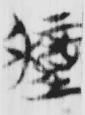穜（種）
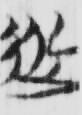迄
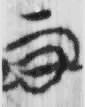○（期）
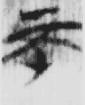不
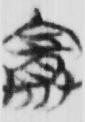賽
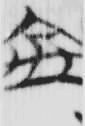金
